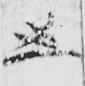之
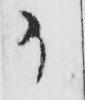人
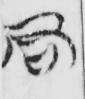君
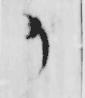人
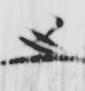之
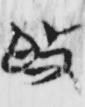{白攴}
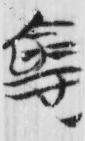愴
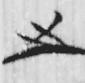之
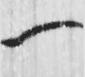一
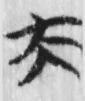夫
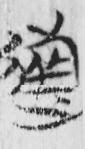○（失）
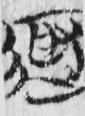趣
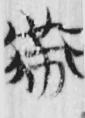巷
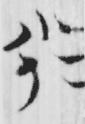小人
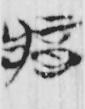𨟻（將）
